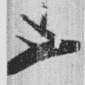之
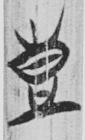壴（矣）
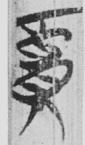○（富）
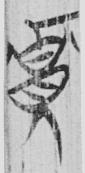貴
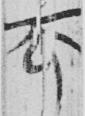而
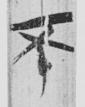不
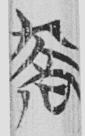喬（驕）
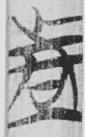者
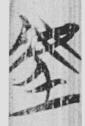○（吾）
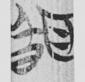○（聞）
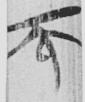而
